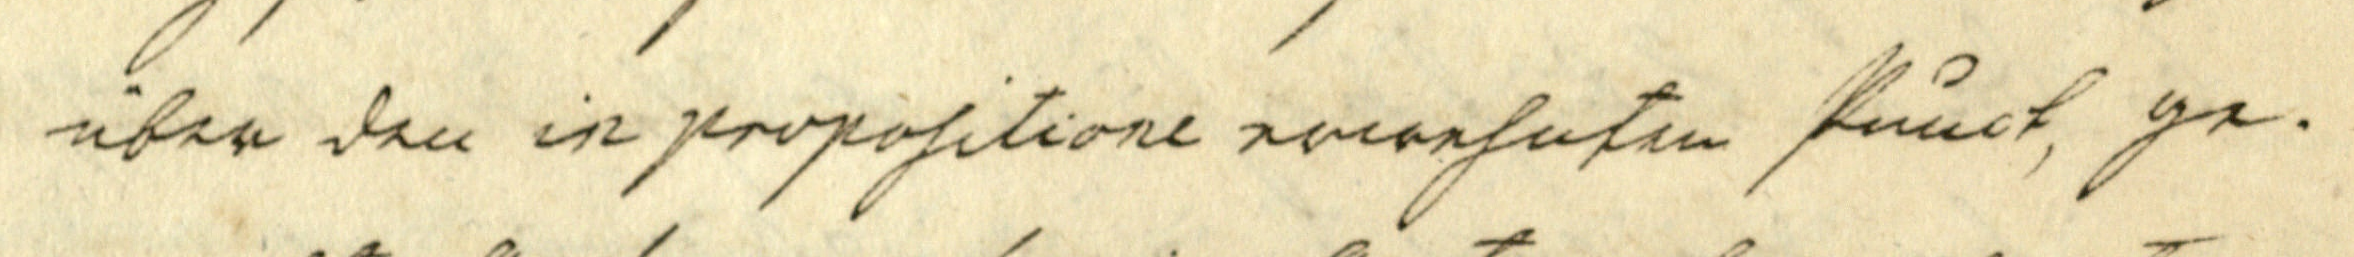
über den in propositione erwehnten Punct, ge¬
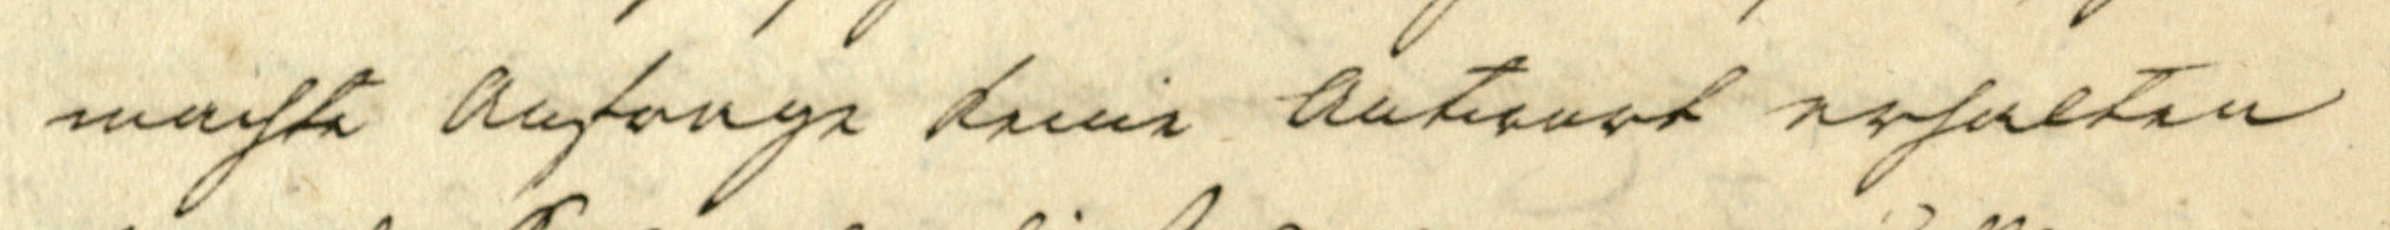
machte Anfrage keine Antwort erhalten
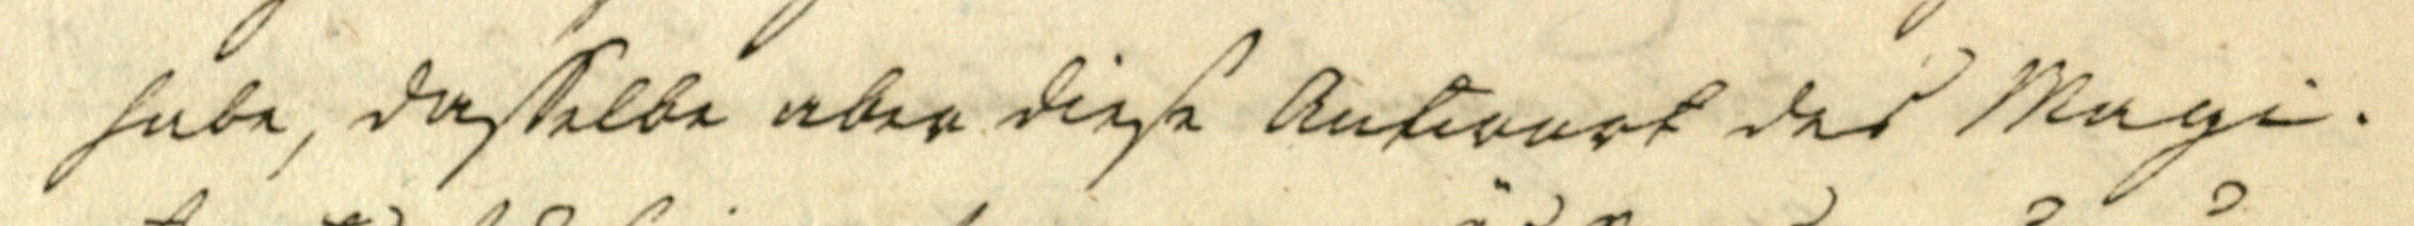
habe, dasselbe aber diese Antwort des Magi¬
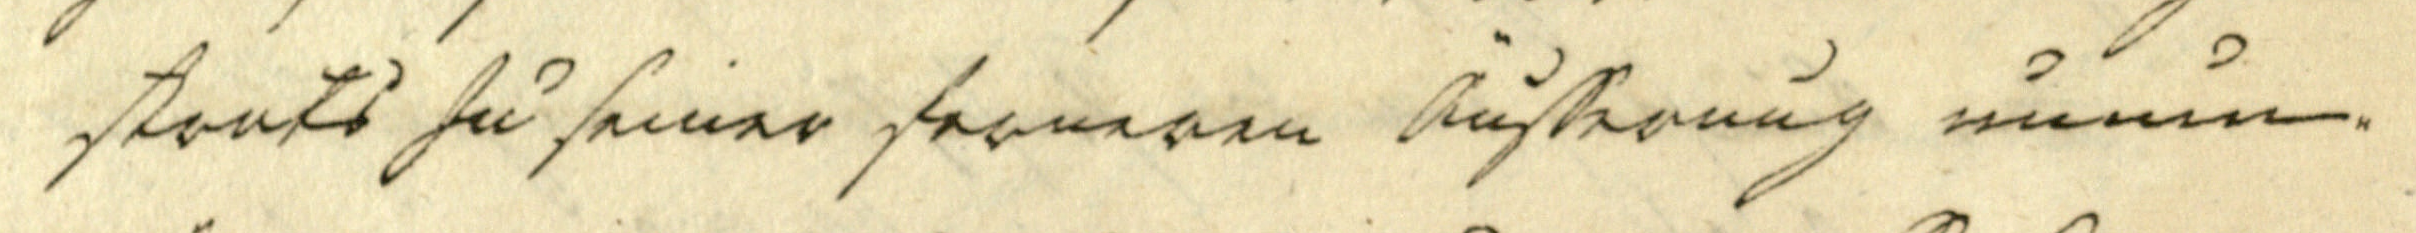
strats zu seiner ferneren Äusserung unum¬
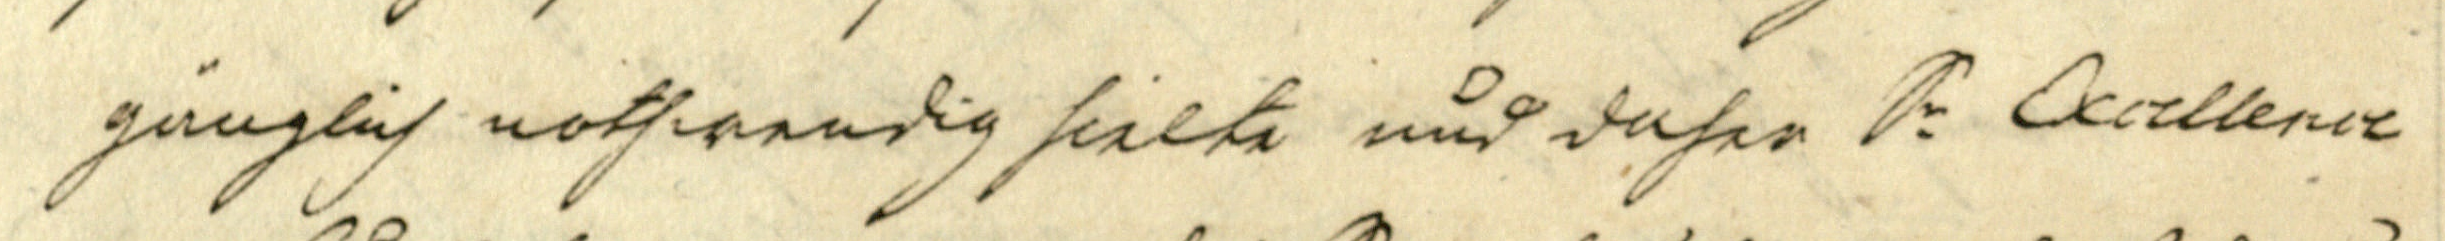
gänglich nothwendig hielte und daher Sr Excellence
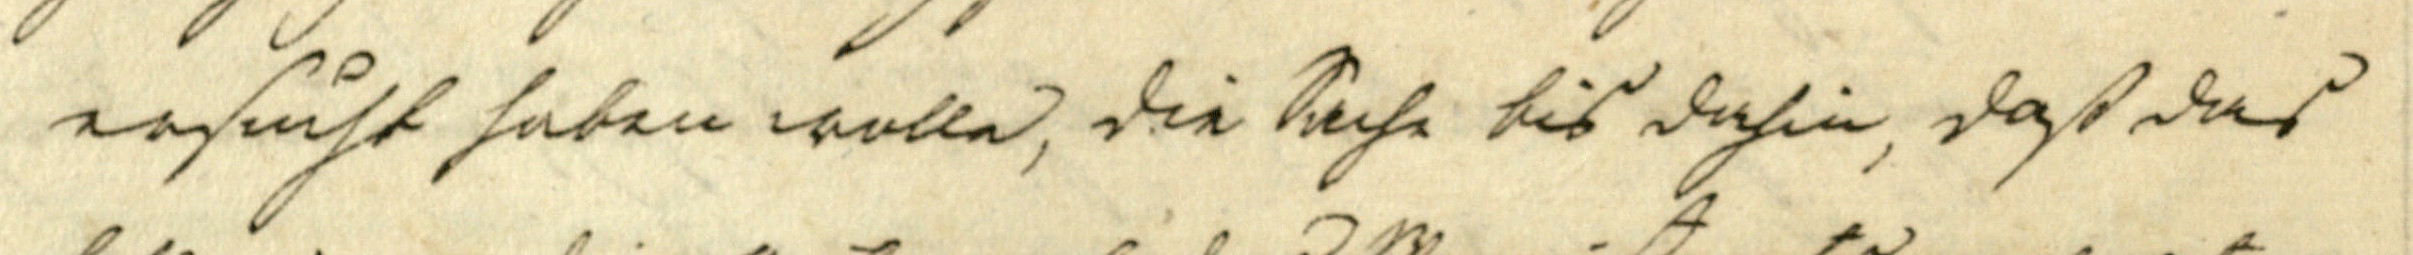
ersucht haben wolle, die Sache bis dahin, daß das
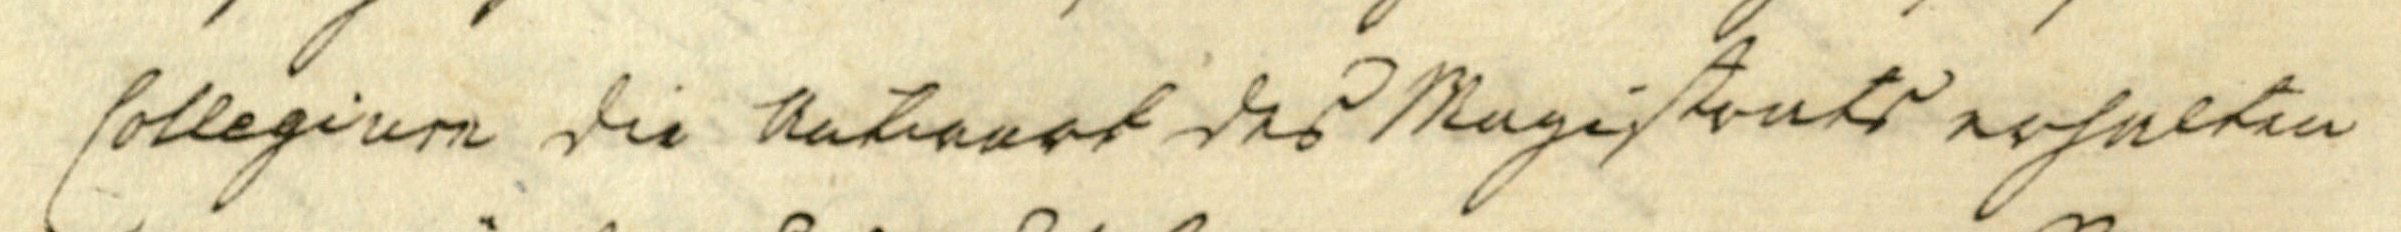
Collegium die Antwort des Magistrats erhalten
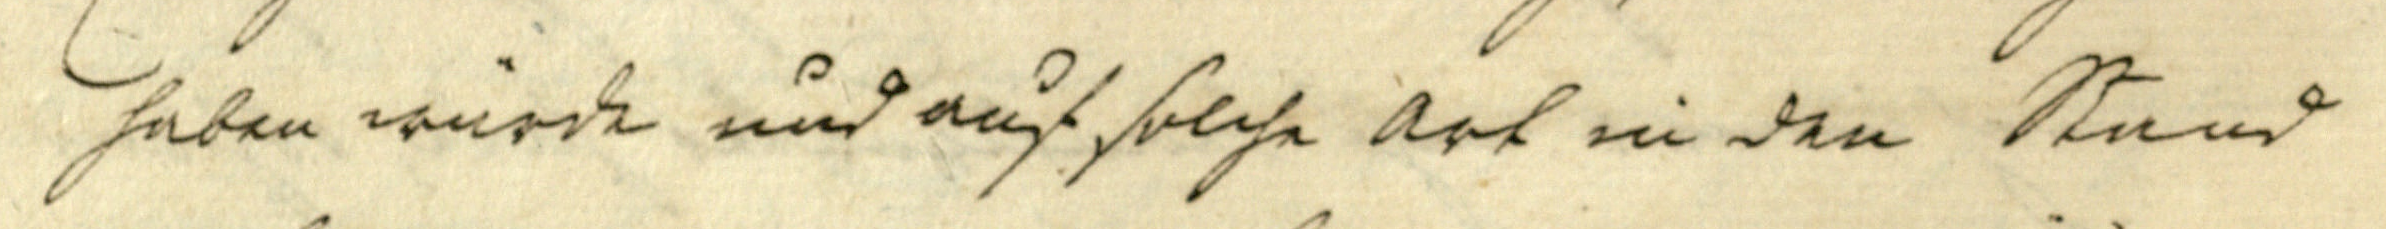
haben würde und auf solche Art in den Stand
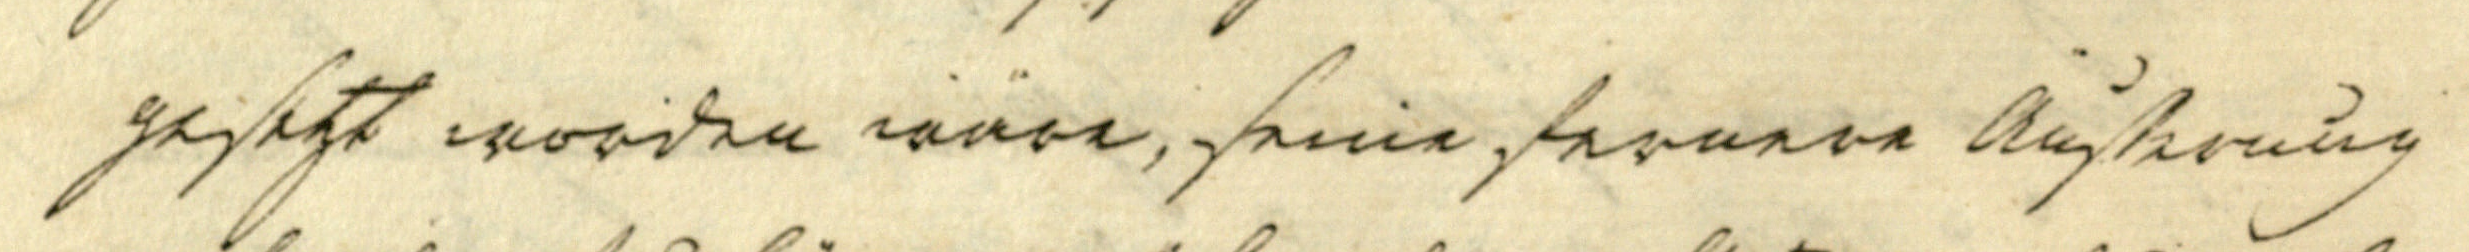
gesetzt worden wäre, seine fernere Äusserung
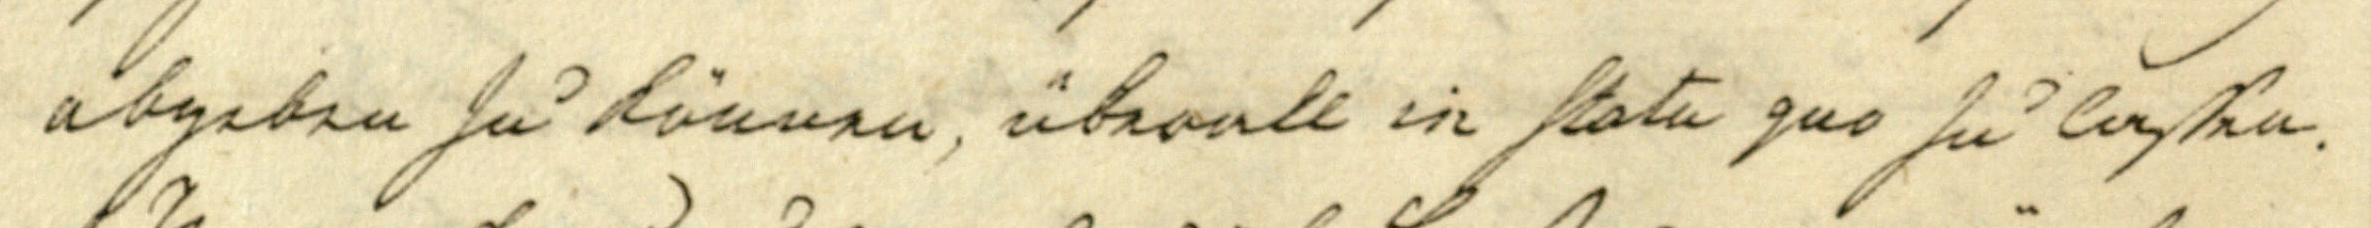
abgeben zu können, überall in statu quo zu lassen.
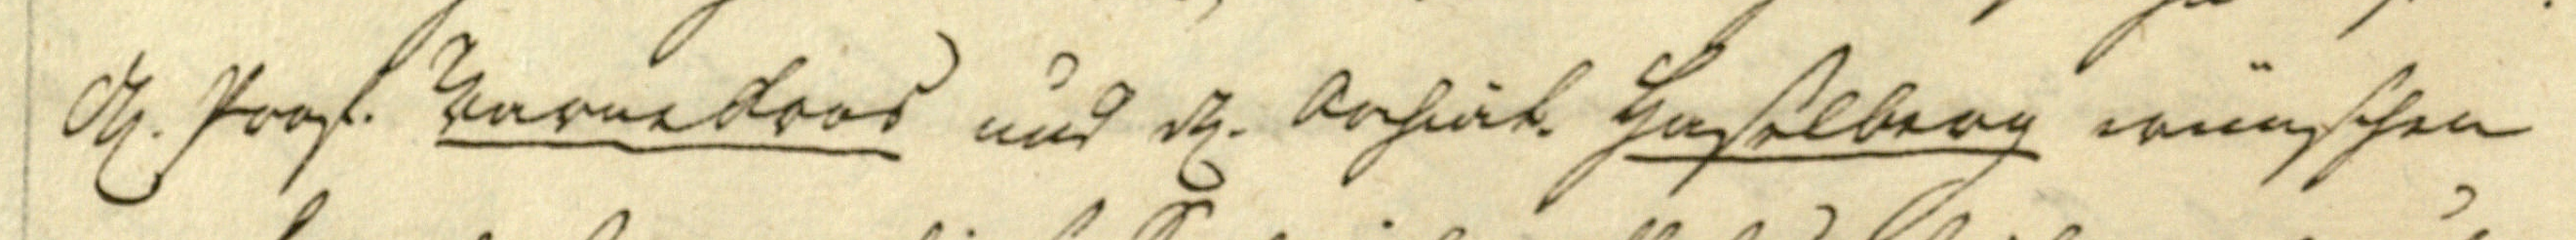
dh. Prof. Warnekros und dh. Archiat. Haselberg wünschen
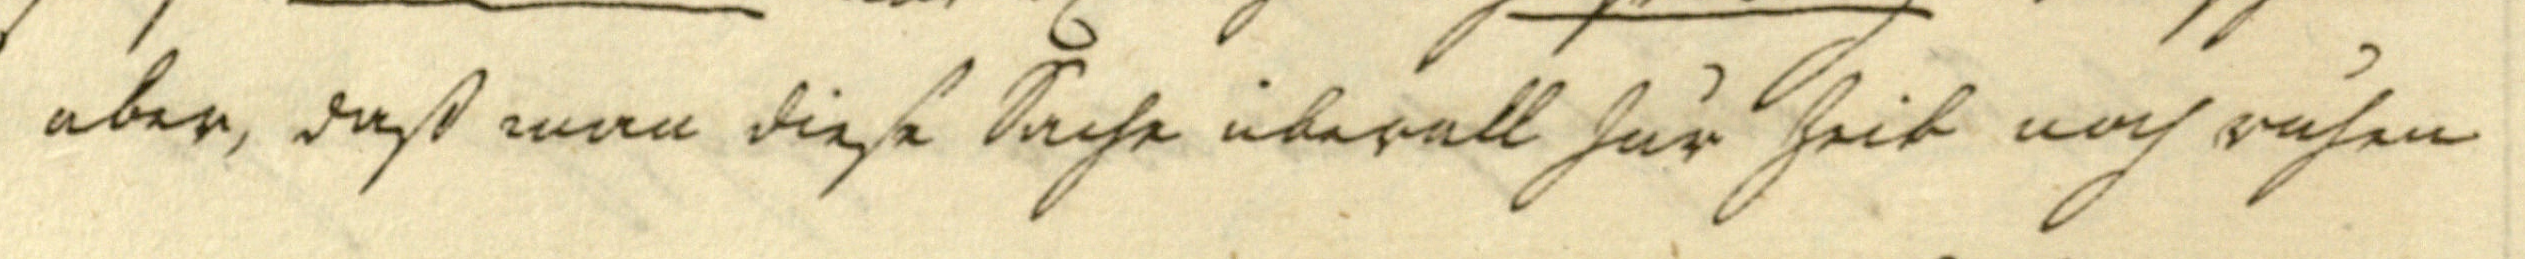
aber, daß man diese Sache überall zur Zeit noch ruhen
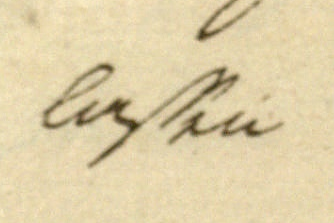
lassen
